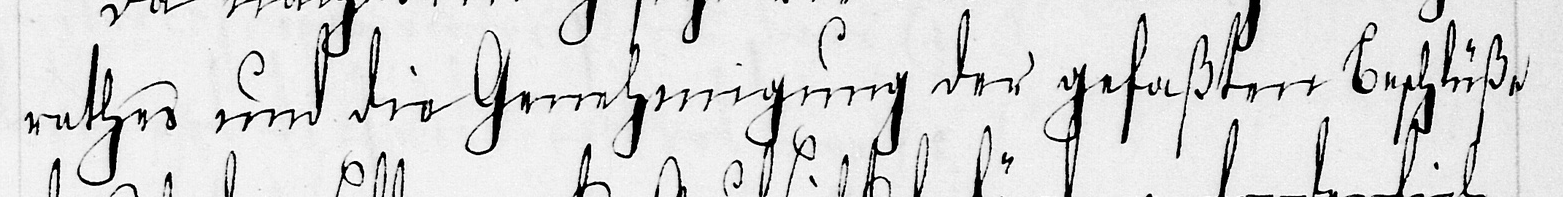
rathes und die Genehmigung der gefaßten Beschlüße
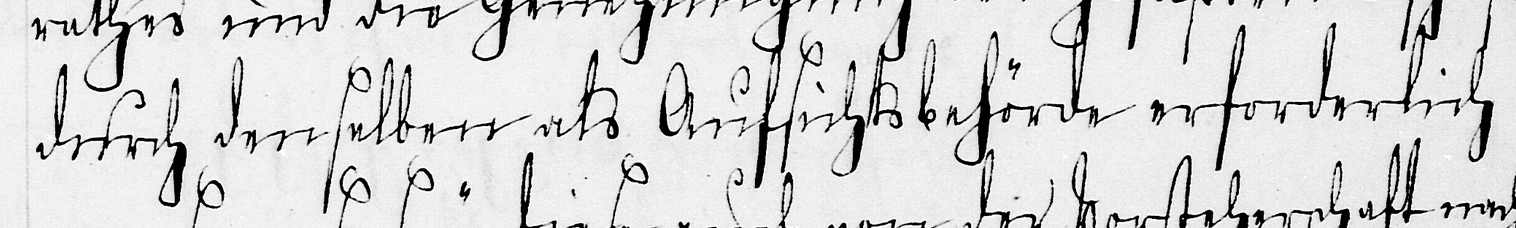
durch denselben als Aufsichtsbehörde erforderlich
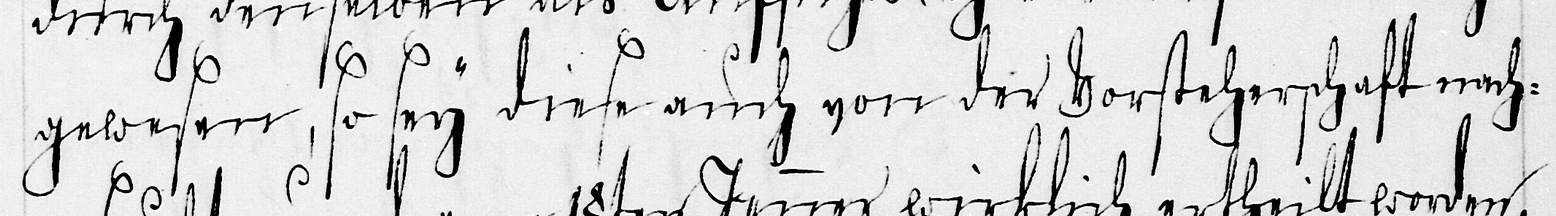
gewesen, so sey diese auch von der Vorsteherschaft nach¬
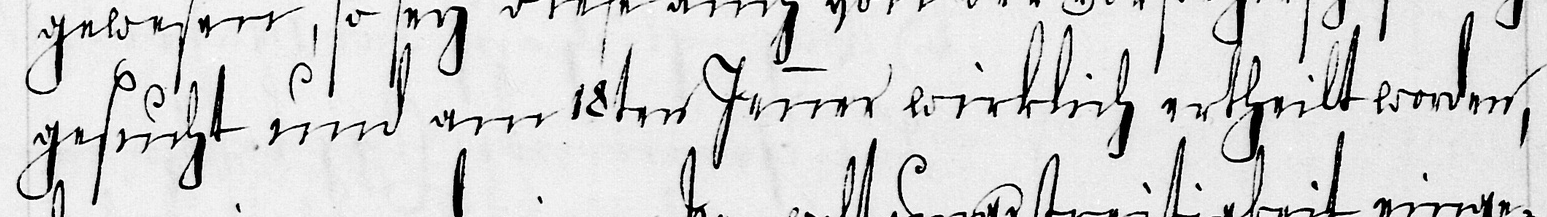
gesucht und am 18ten Jenner wirklich ertheilt worden,
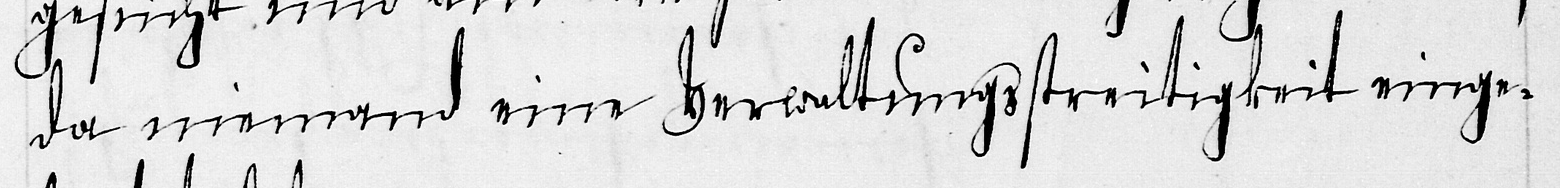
da niemand eine Verwaltungsstreitigkeit einge¬
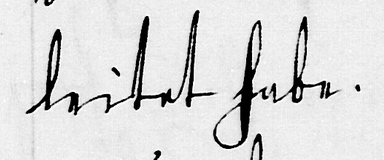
leitet habe.
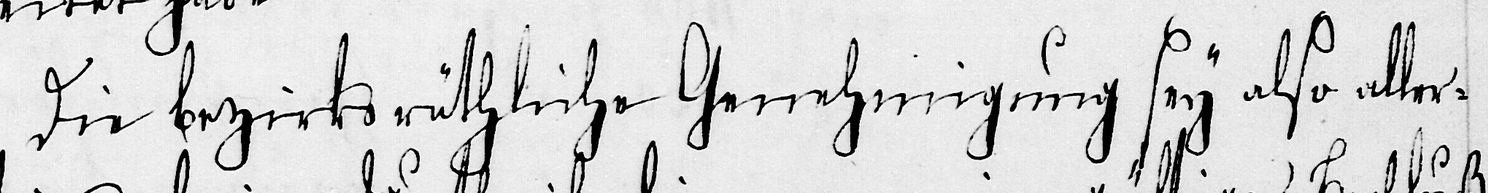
Die bezirksräthliche Genehmigung sey also alle¬
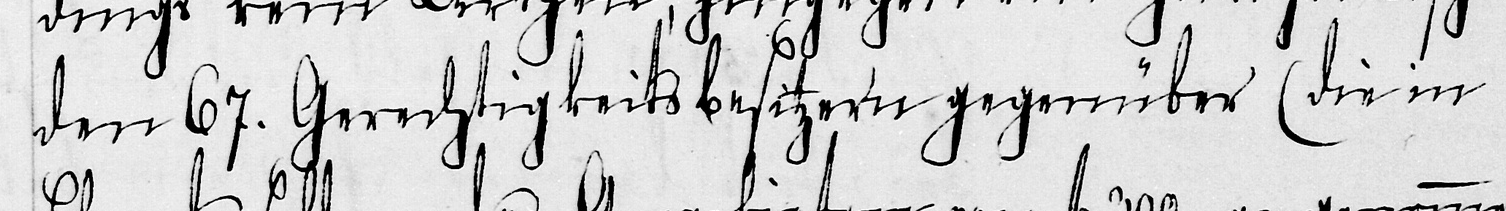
den 67. Gerechtigkeitsbesitzern gegenüber (die in
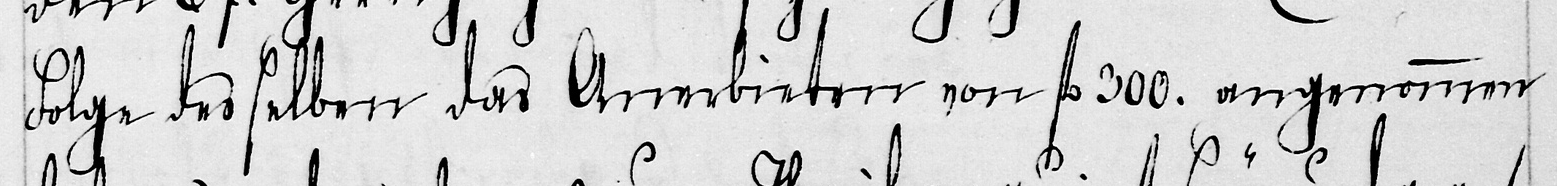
Folge desselben das Anerbieten von fl. 300. angenommen
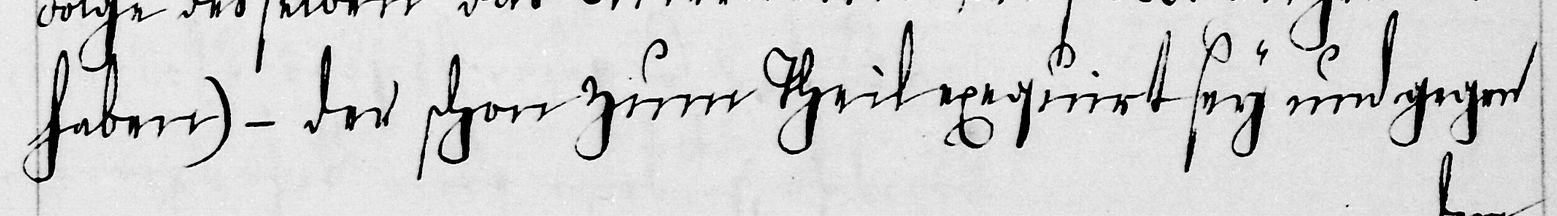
haben) – der schon zum Theil exequirt sey und gegen
